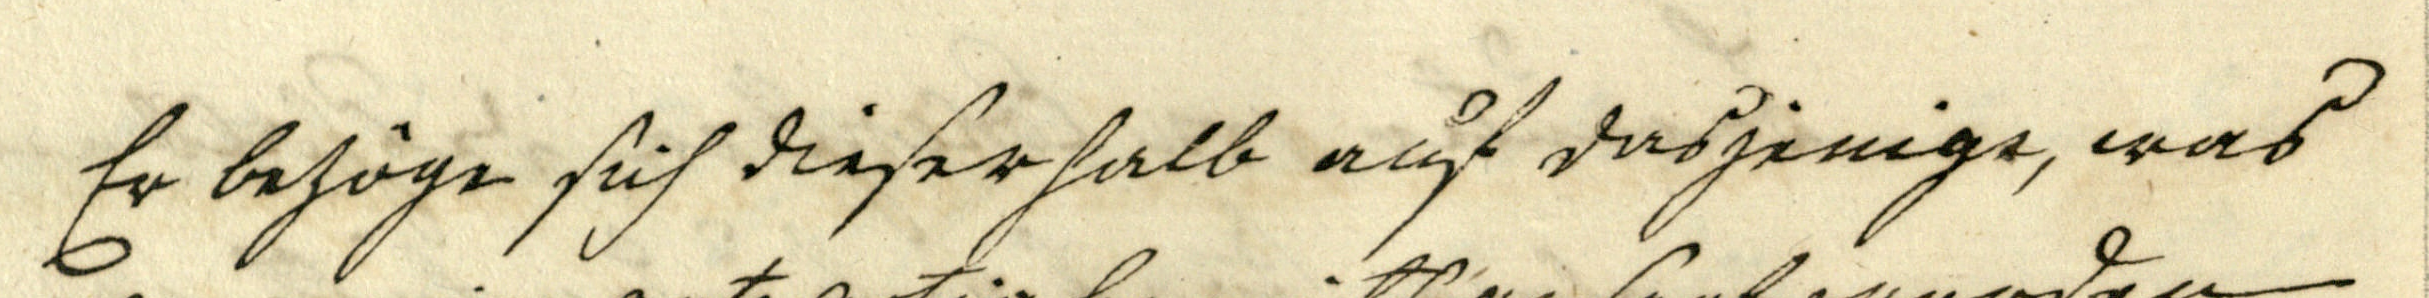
Er bezöge sich dieserhalb auf dasjenige, was
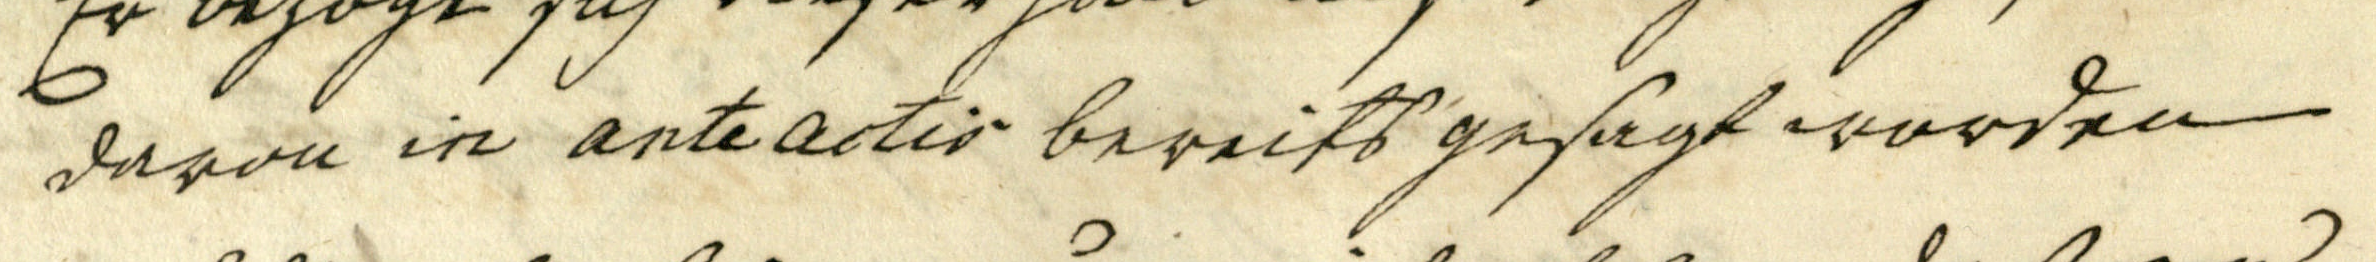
davon in ante Actis bereits gesagt worden
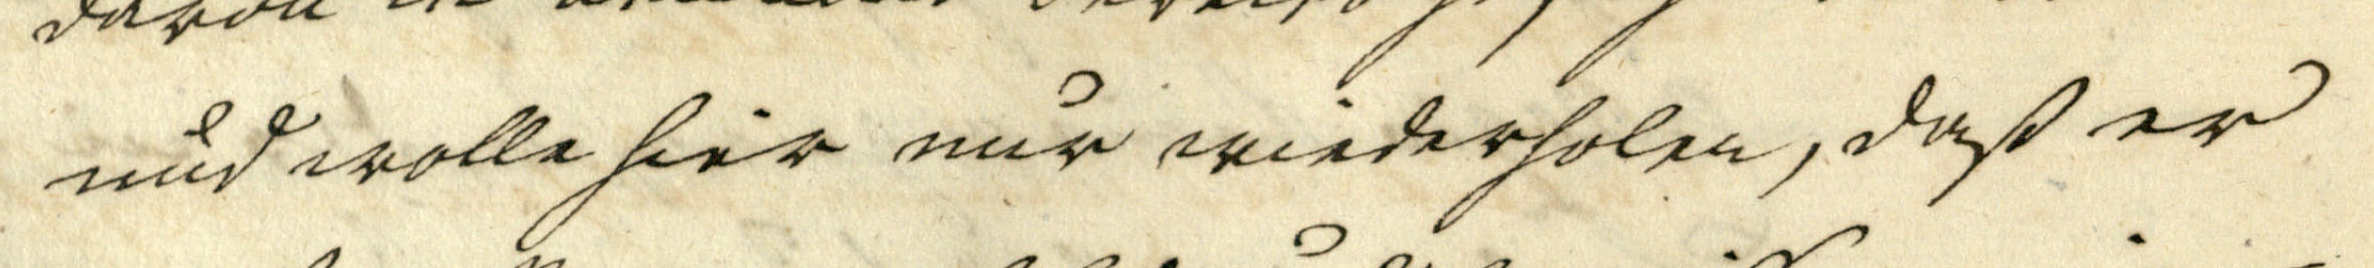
und wolle hier nur wiederholen, daß er
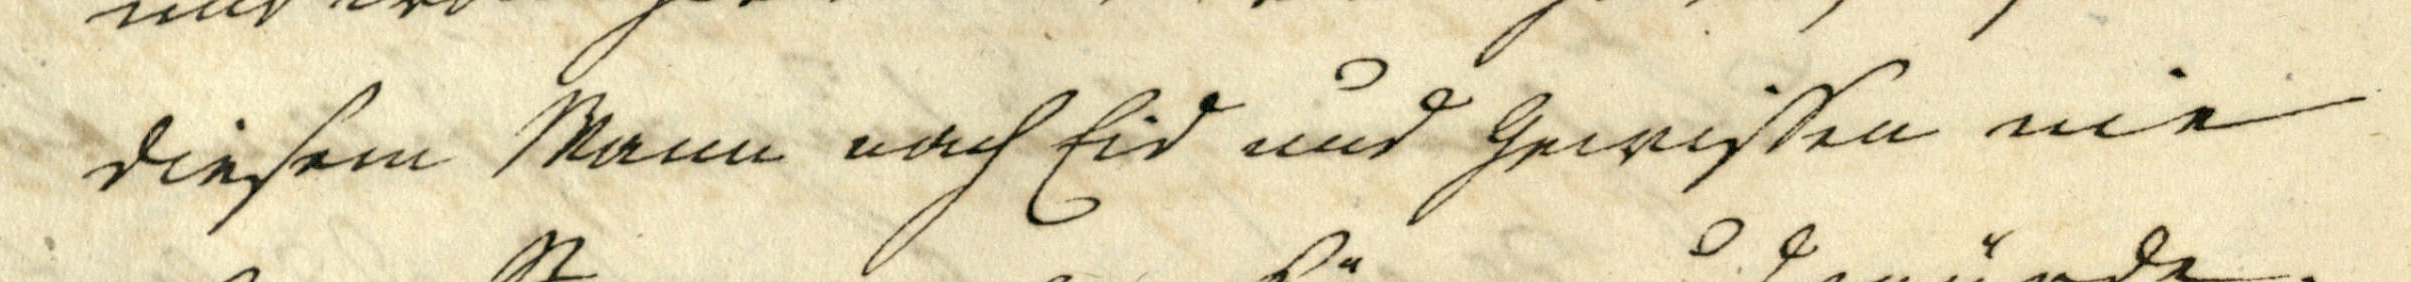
diesem Mann nach Eid und Gewissen nie
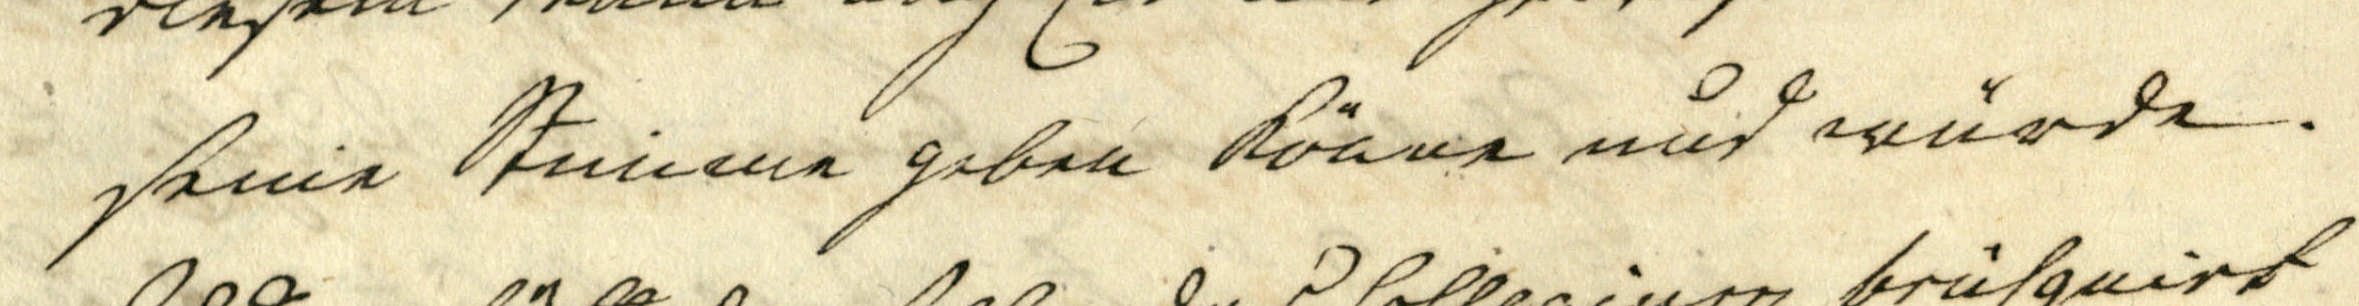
seine Stimme geben könne und würde.
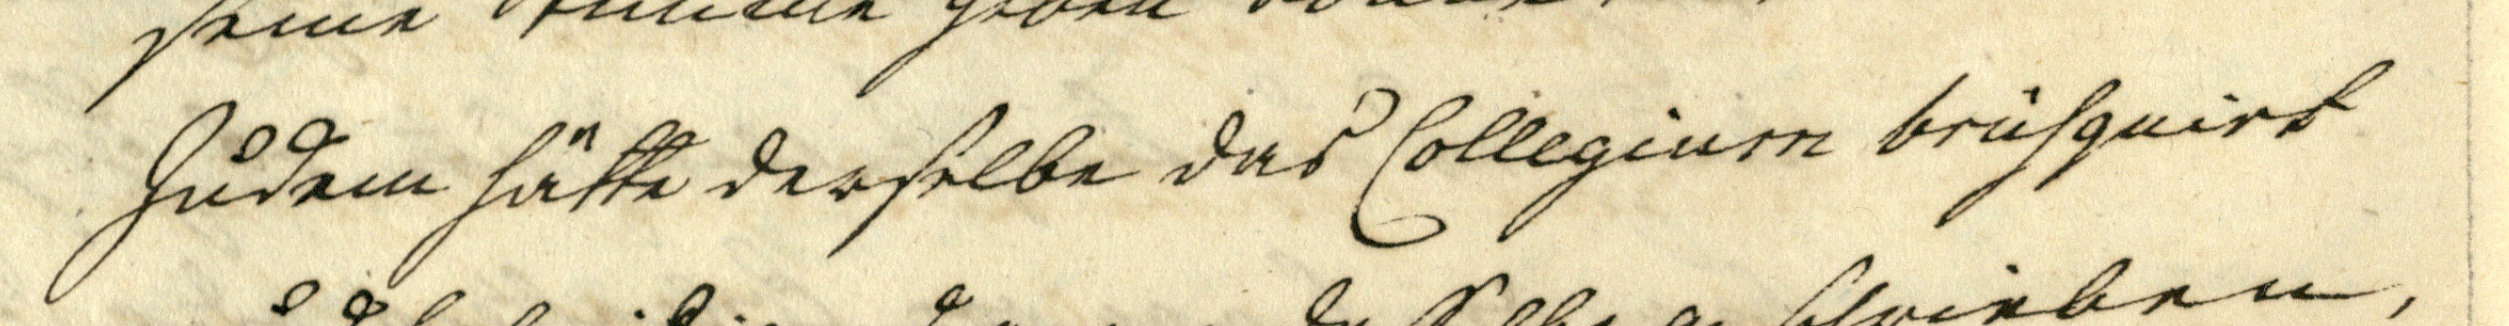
Zudem hätte derselbe das Collegium brüsquirt
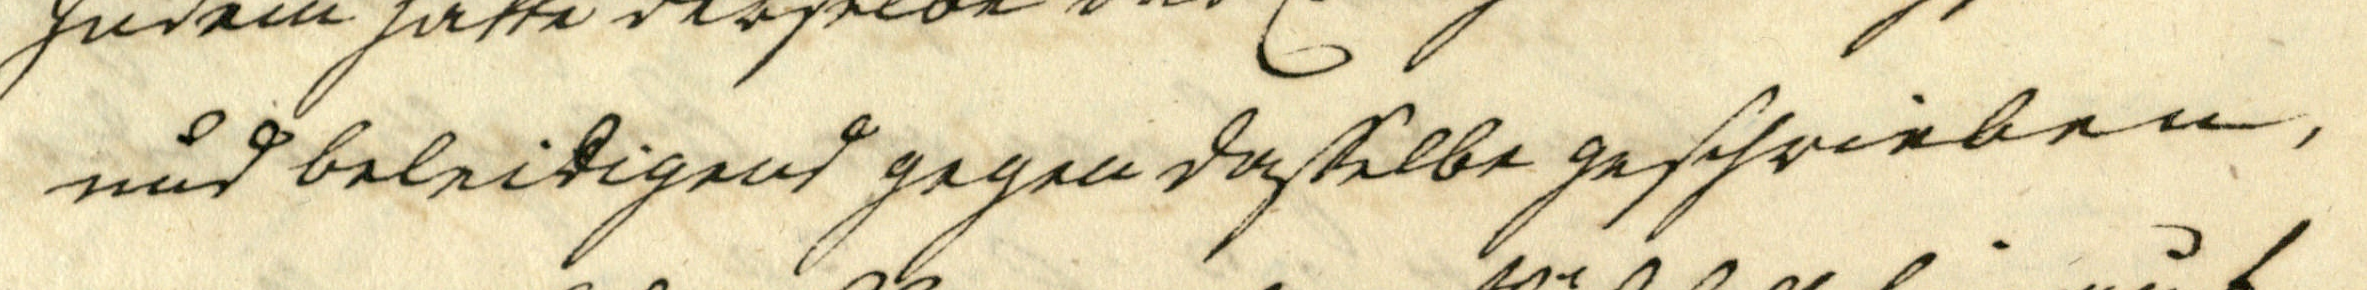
und beleidigend gegen dasselbe geschrieben,
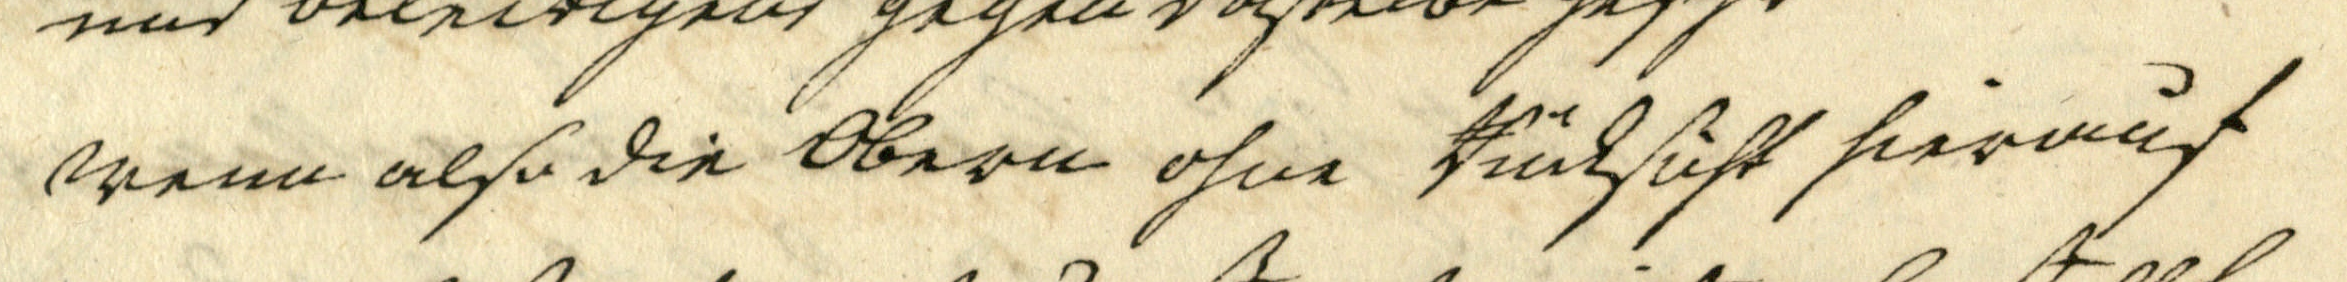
wenn also die Obern ohne Rücksicht hierauf
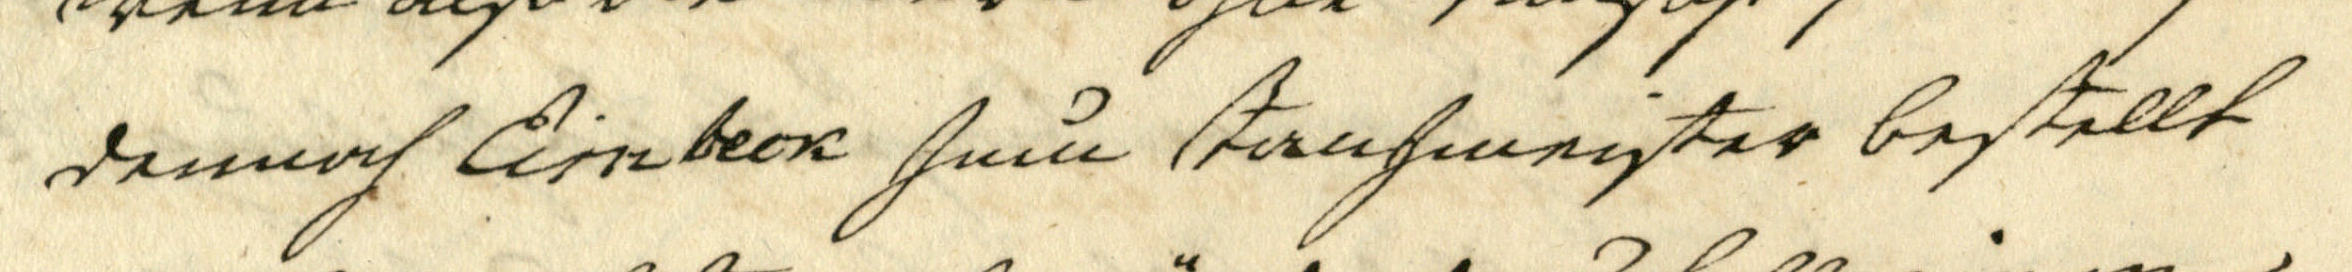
dennoch Eimbeck zum Tanzmeister bestellt
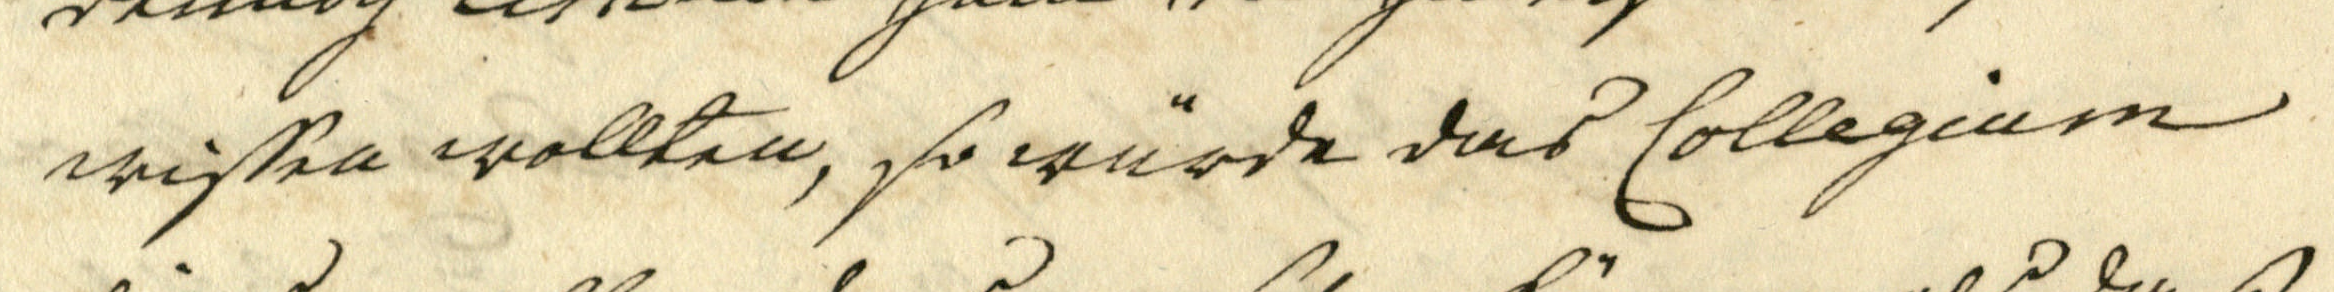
wissen wollten, so würde das Collegium
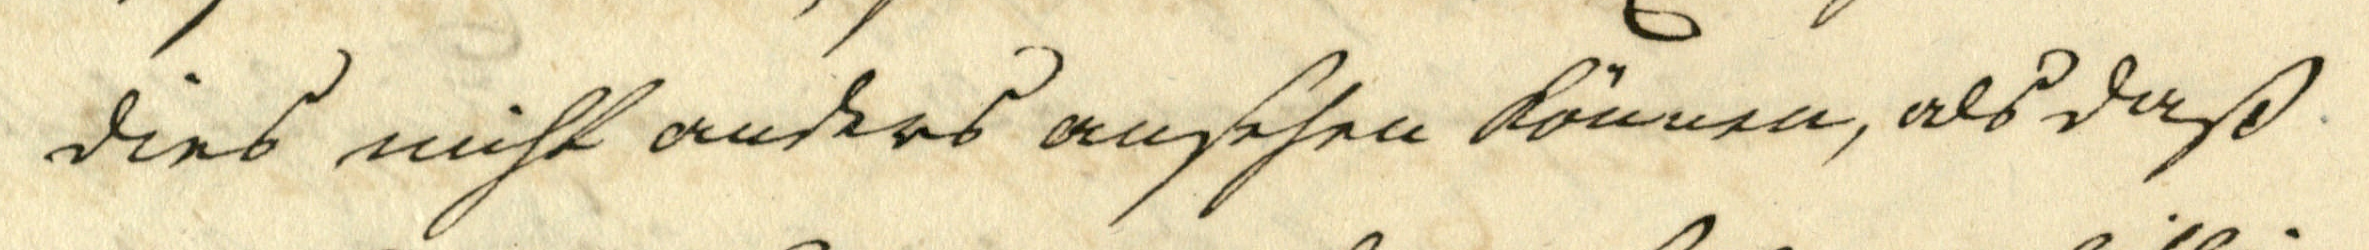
dies nicht anders ansehen können, als daß
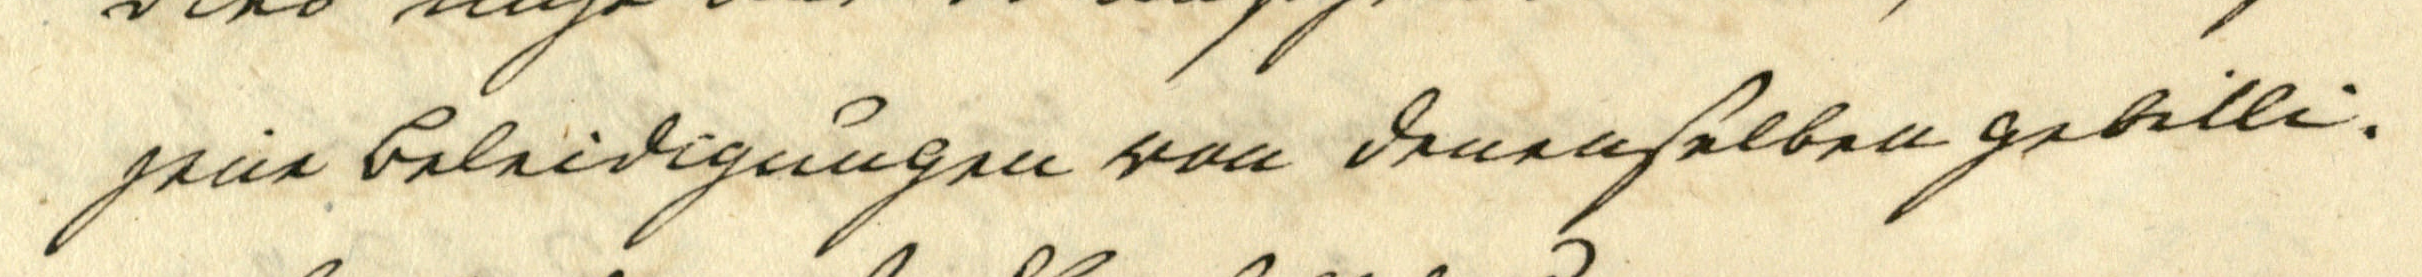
eine Beleidigungen von denenselben gebilli¬
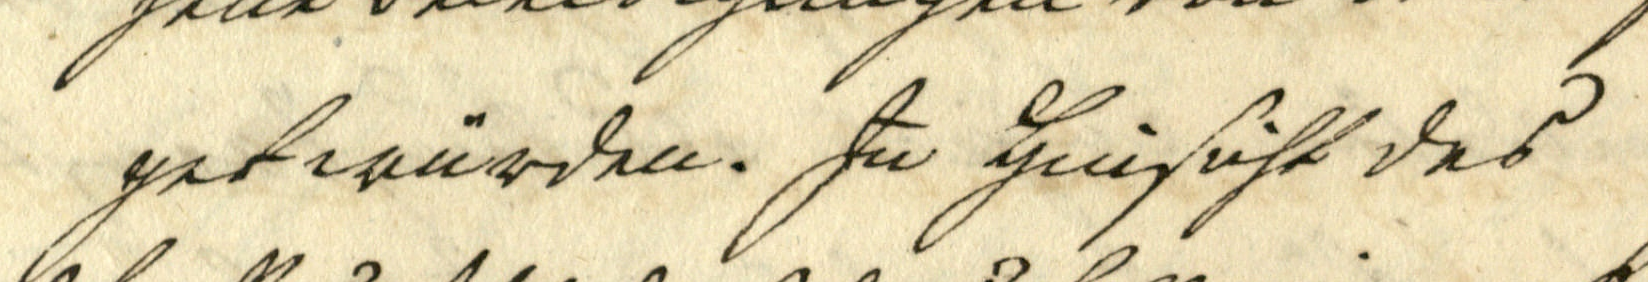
get würden. In Hinsicht des
